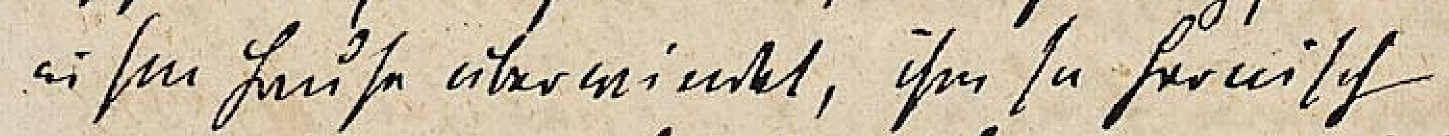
in sm Hause überwindet, ihn sn Harnisch
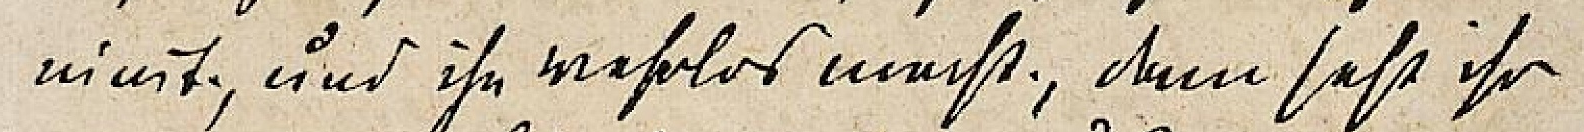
nimt, und ihn wehrlos macht, dann seht ihr
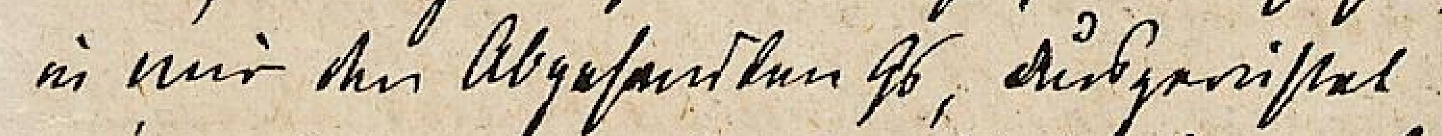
in mir den Abgesandten Gs, ausgerüstet
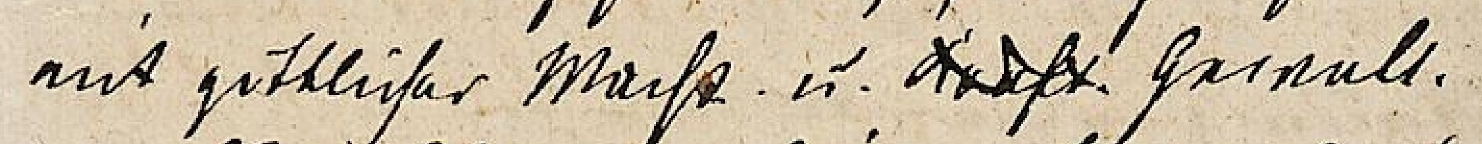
mit göttlicher Macht u. Kraft Gewalt.
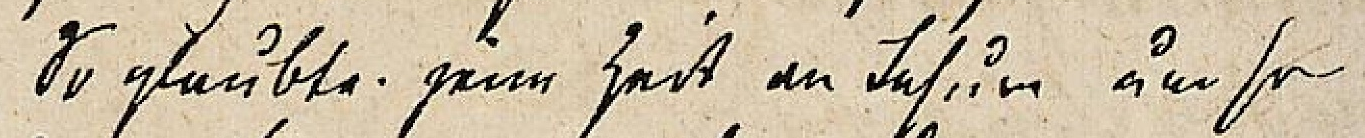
So glaubte jene Zeit an Jesum um sr
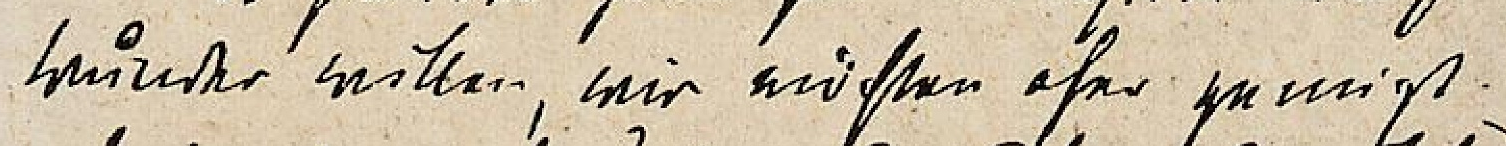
Wunder willen, wir möchten eher geneigt
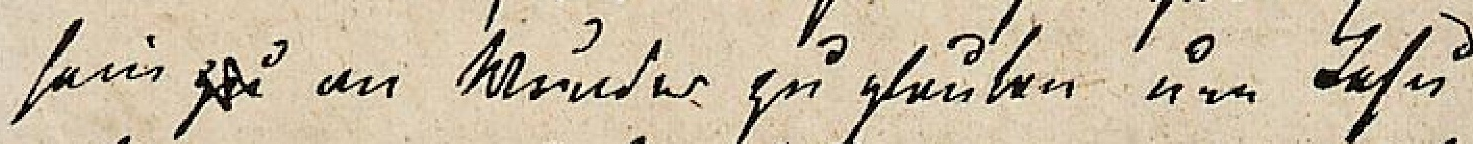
sein zu an Wunder zu glauben um Jesu
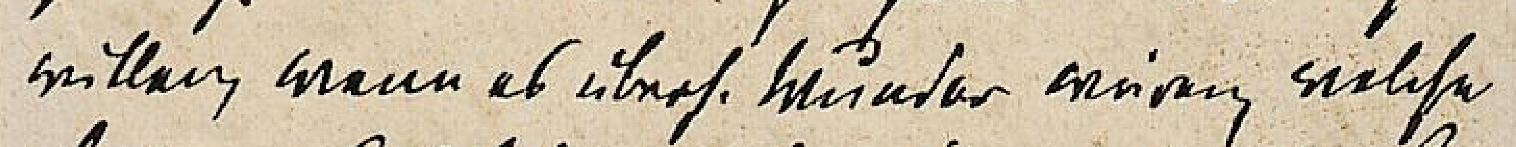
willen, wenn es überh. Wunder wären, welche
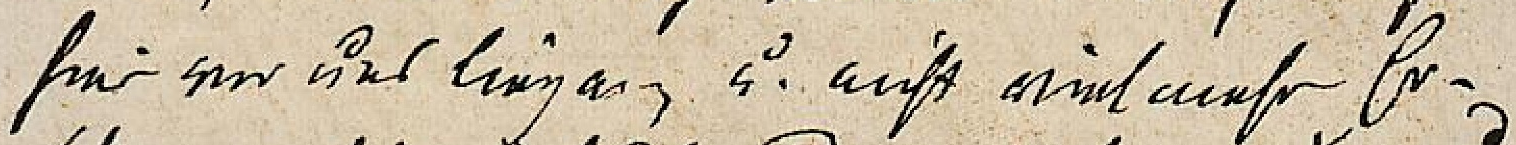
hier vor uns lägen, u. nicht viel mehr Er¬
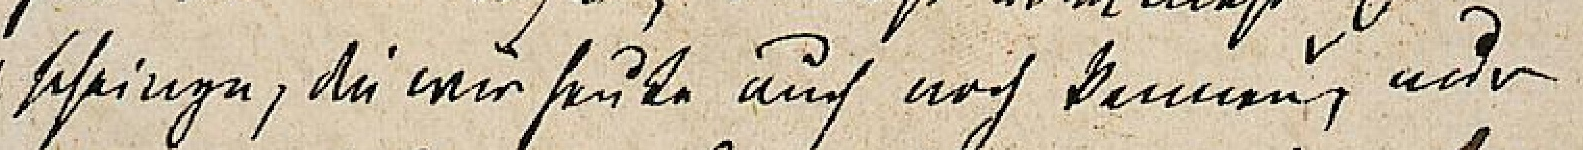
scheingn, die wir heute auch noch kennen, nur
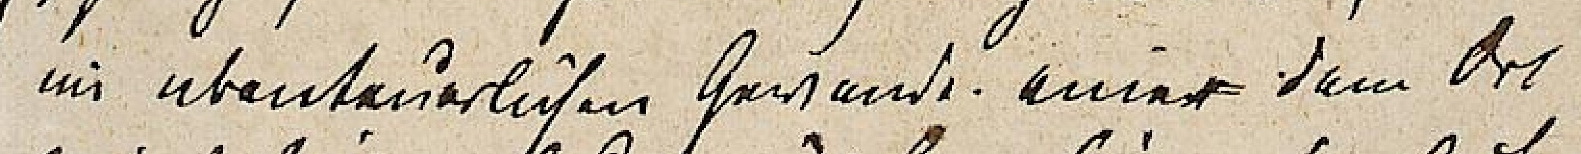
in abenteuerlichem Gewande einer dem Ort
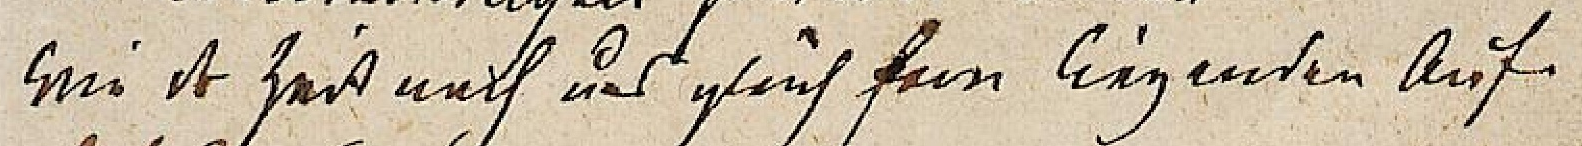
wie der Zeich nach uns gleich fern liegenden Auf¬
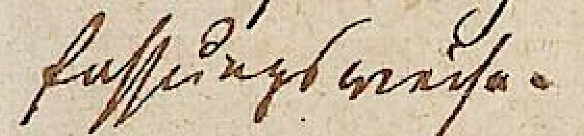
fassungsweise.
